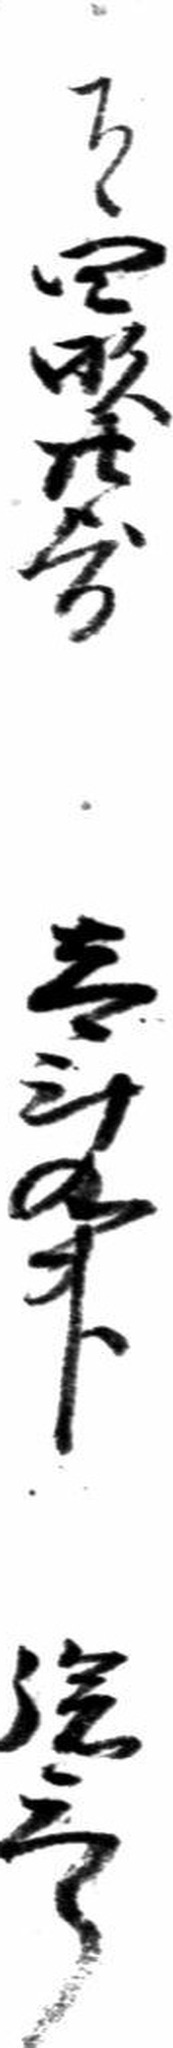下々四畝廿歩壱斗九升孫三郎
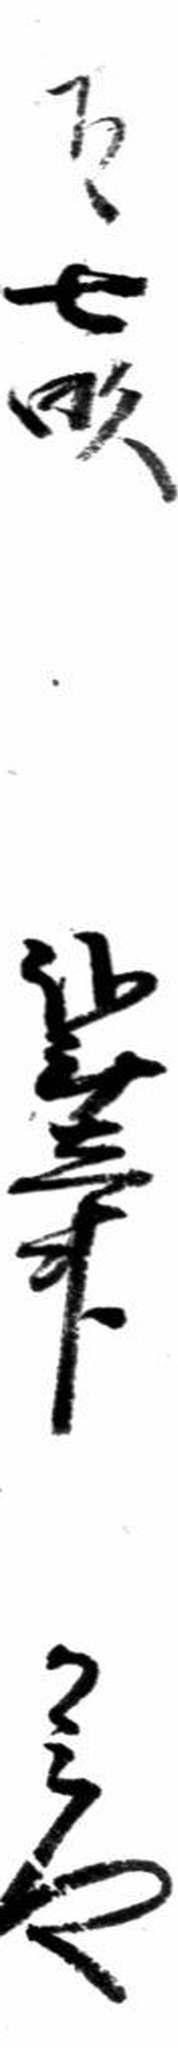下々七畝弐斗壱升かみや
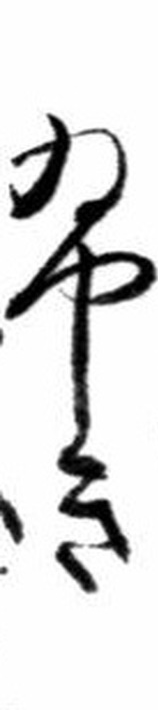ゐやしき
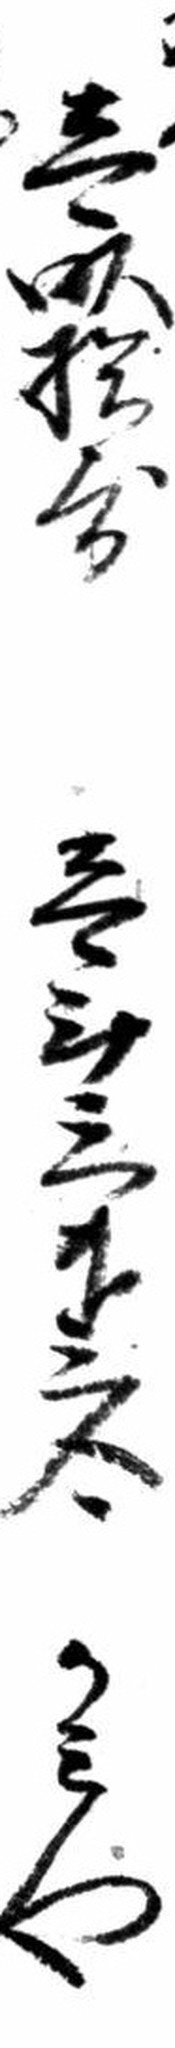壱畝拾歩壱斗三升三合かみや
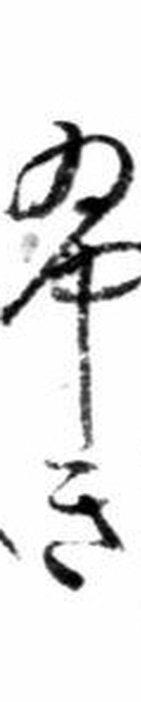ゐやしき
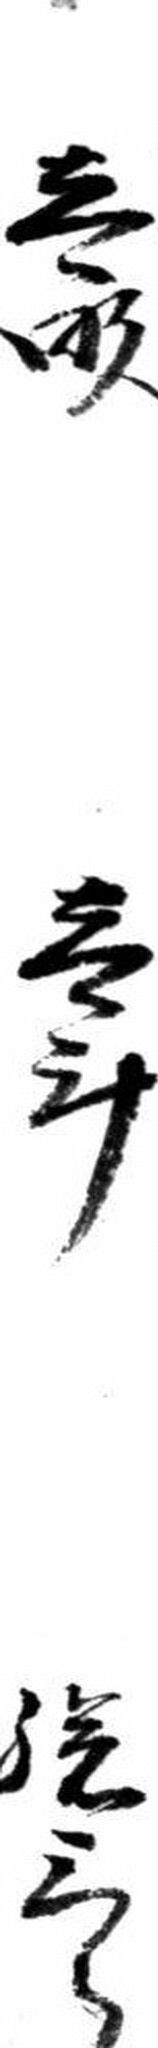壱畝壱斗孫三郎
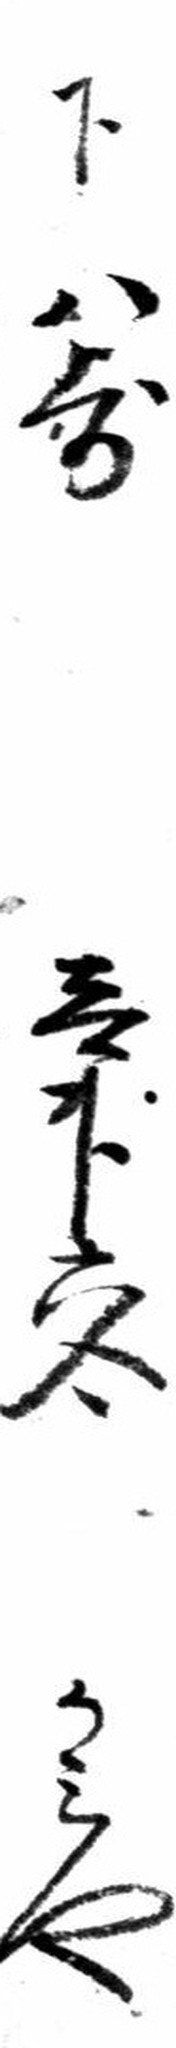下八歩壱升六合かみや
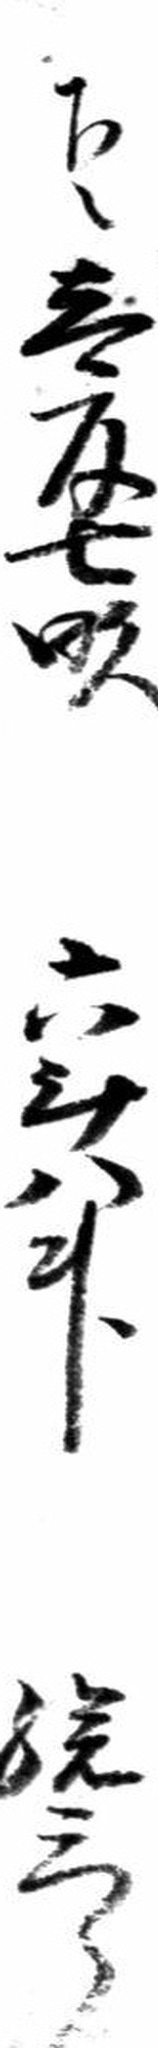下々壱反七畝六斗八升孫三郎
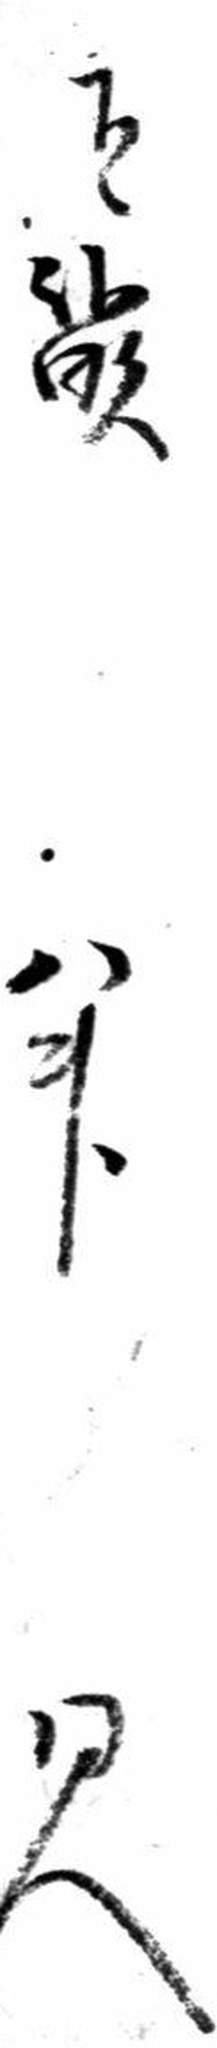下々弐畝八升同人

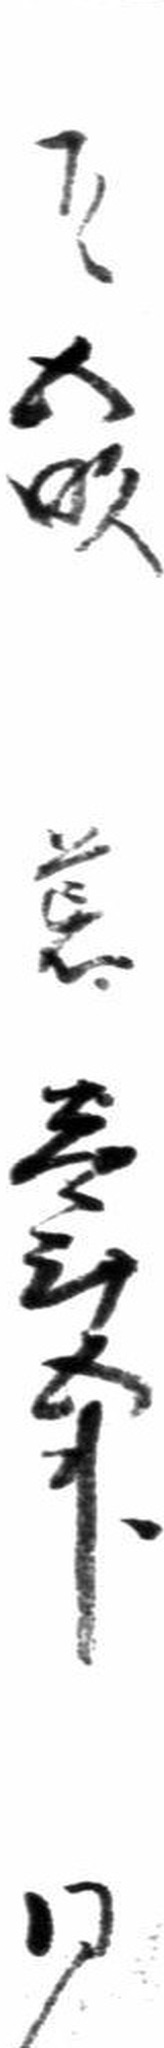下々五畝荒壱斗五升同人
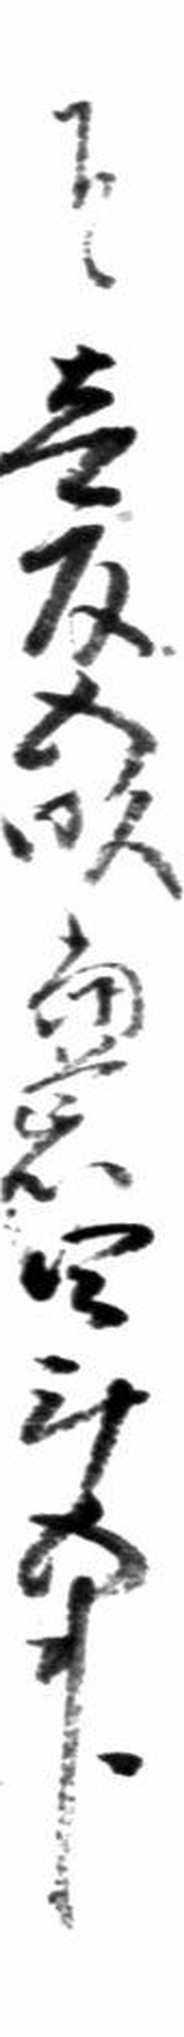下々壱反五畝当荒四斗五升同人
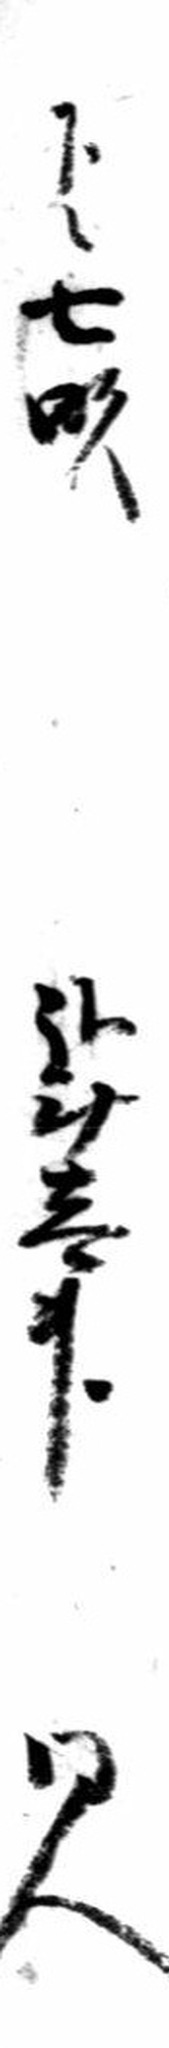下々七畝弐斗壱升同人
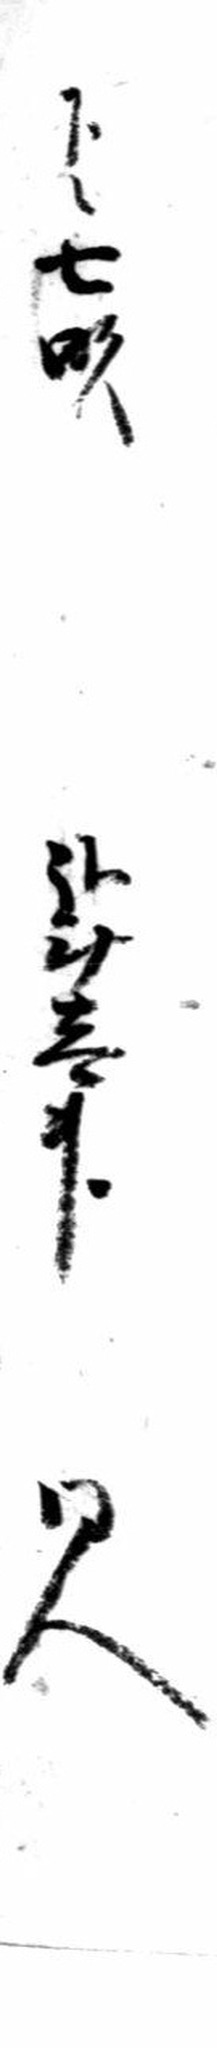下々七畝弐斗壱升同人
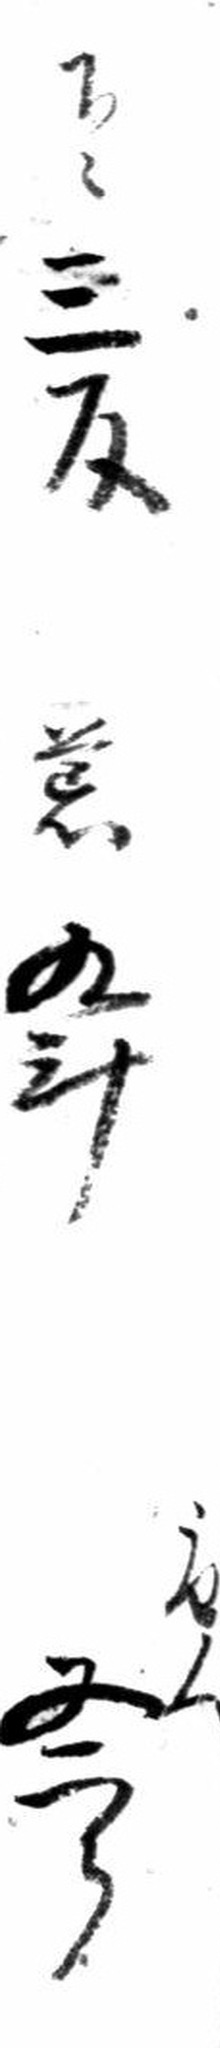下々三反荒九斗又二郎
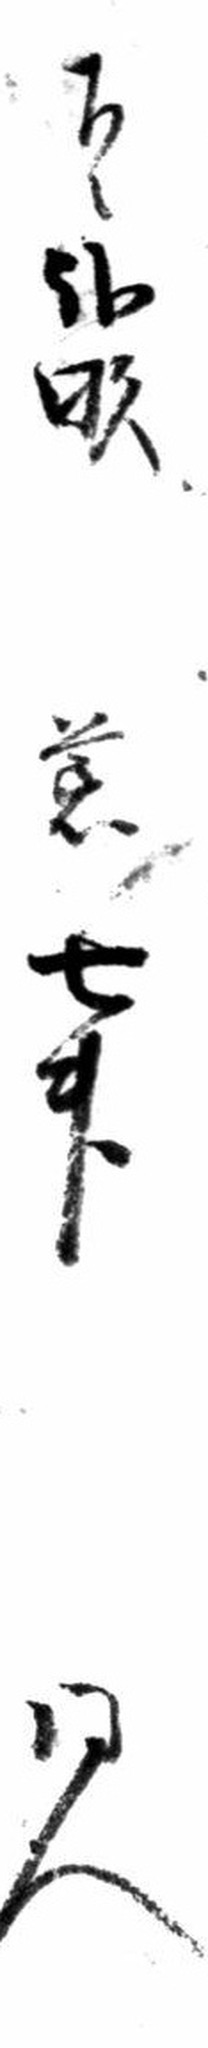下々弐畝荒七升同人
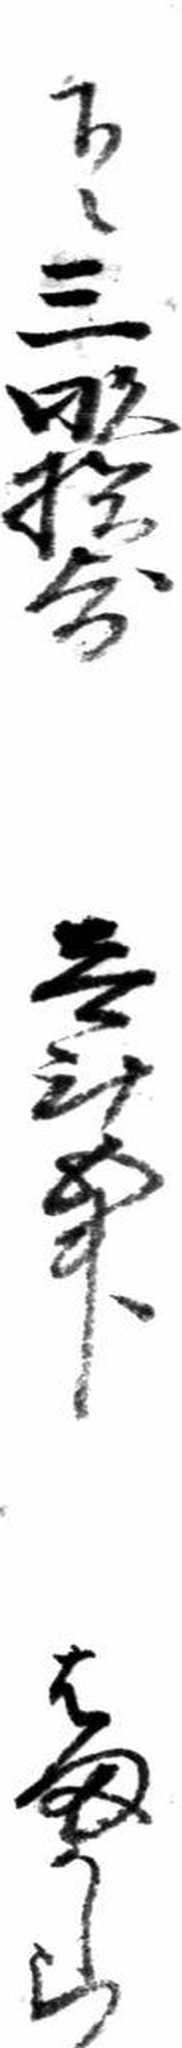下々三畝拾歩壱斗五升はまかしら
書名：若州三方郡之内世久見浦御検地帳（世久見浦検地帳写）
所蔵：福井県文書館 Fukui Prefectural Archives
